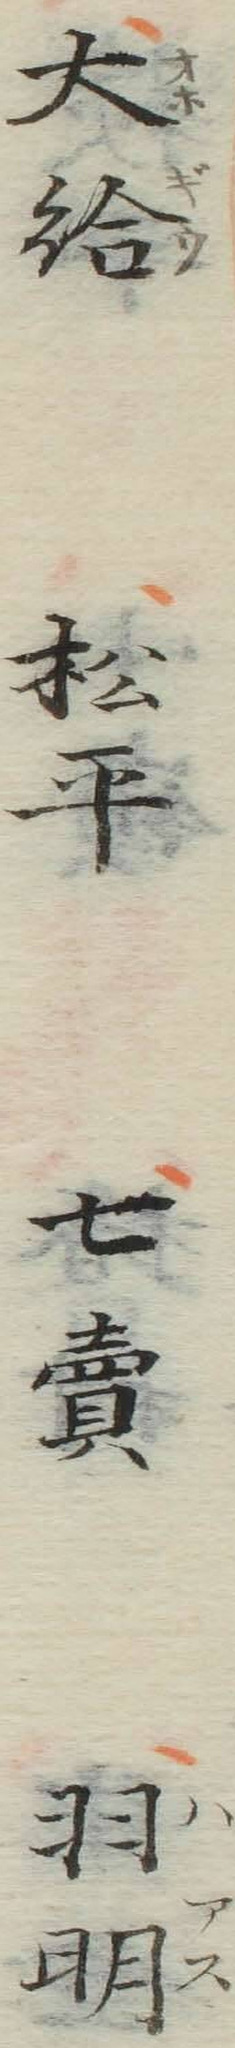大給松平七賣羽明
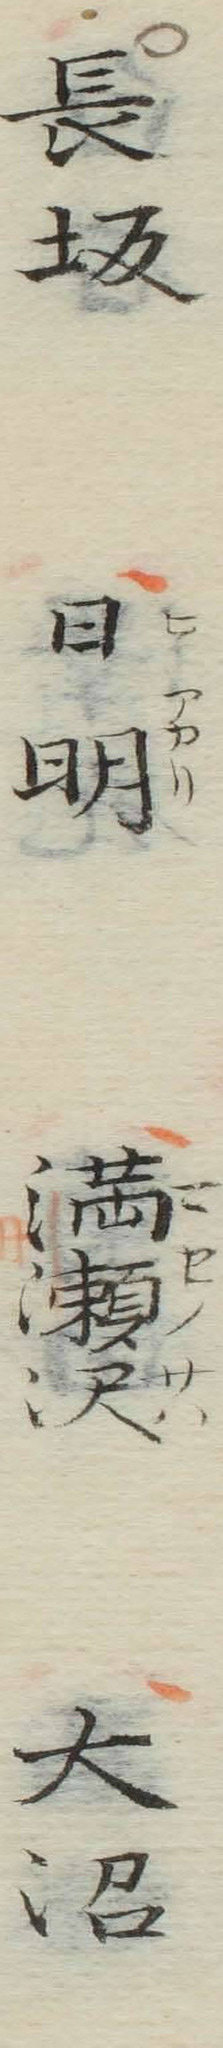○長坂日明満瀬沢大沼
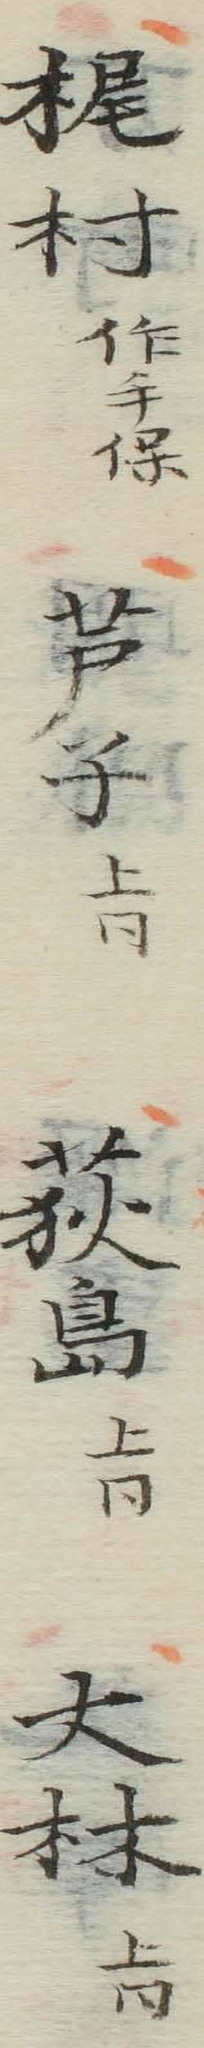梶村作手保芦子上同荻島上同大林上同
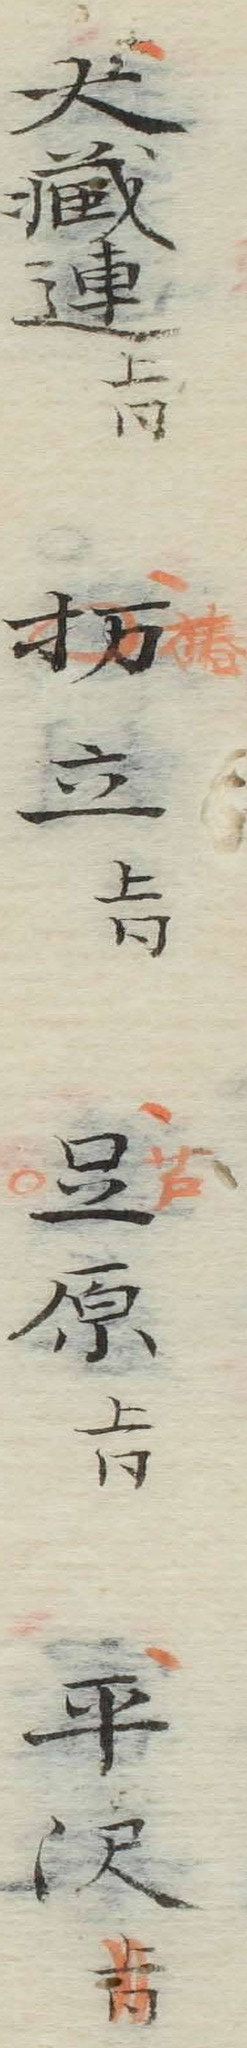大藏連上同椿立上同足芦原上同平沢上同
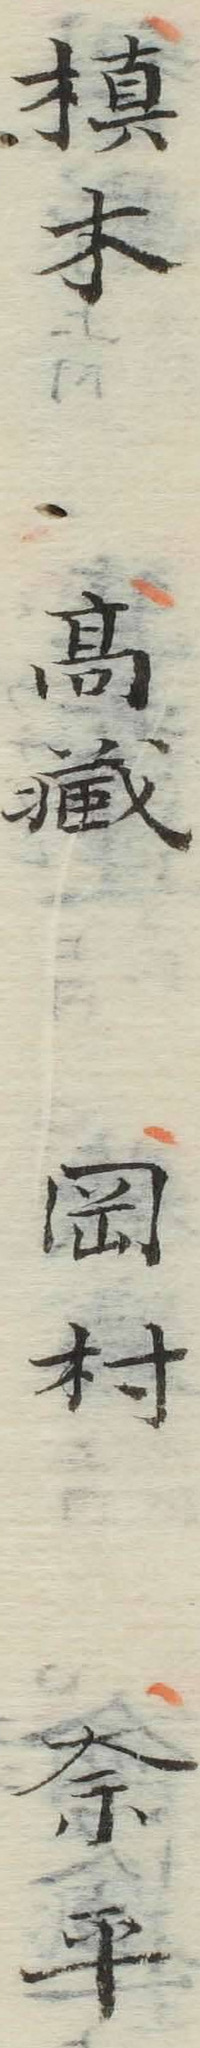槙木髙藏岡村奈平
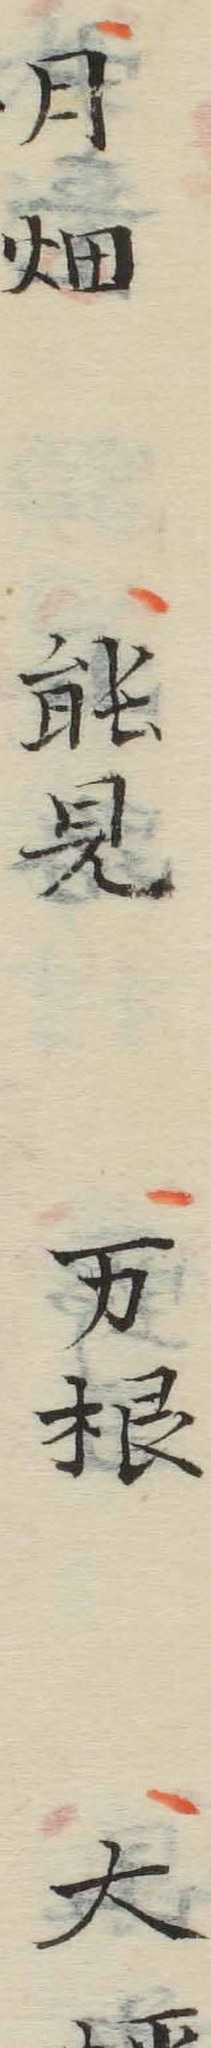月畑能見万根大坪
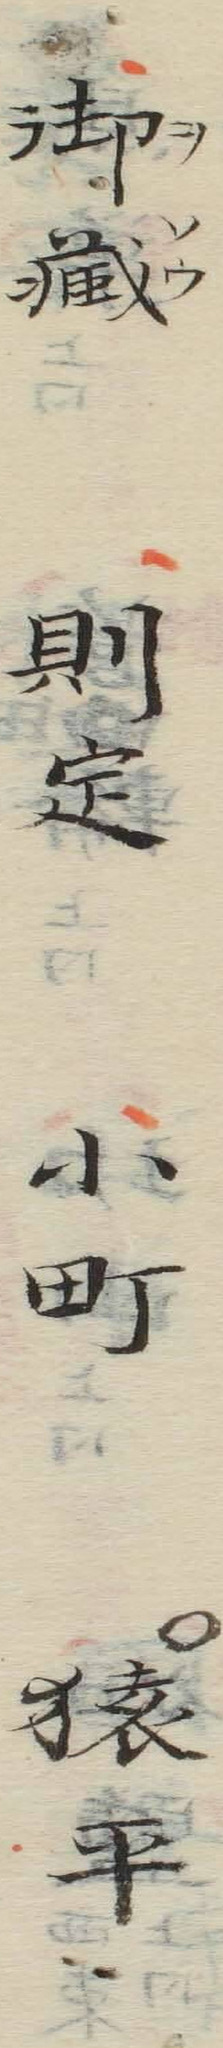御藏則定小町○猿平
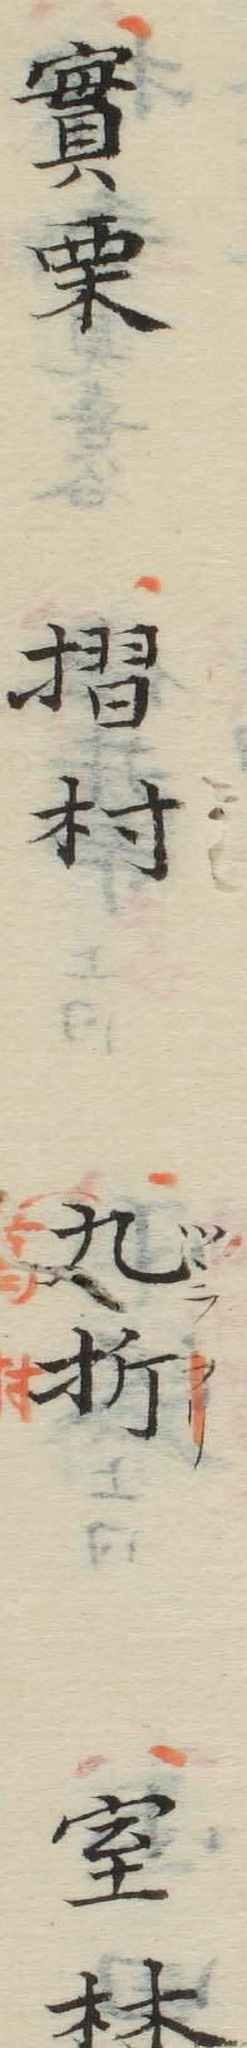實栗摺村九折室林
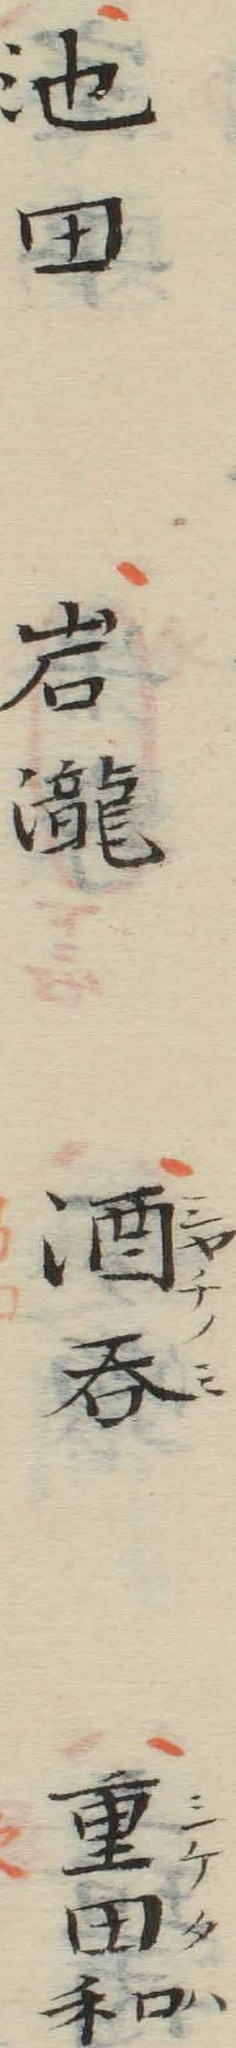池田岩瀧酒呑重田和
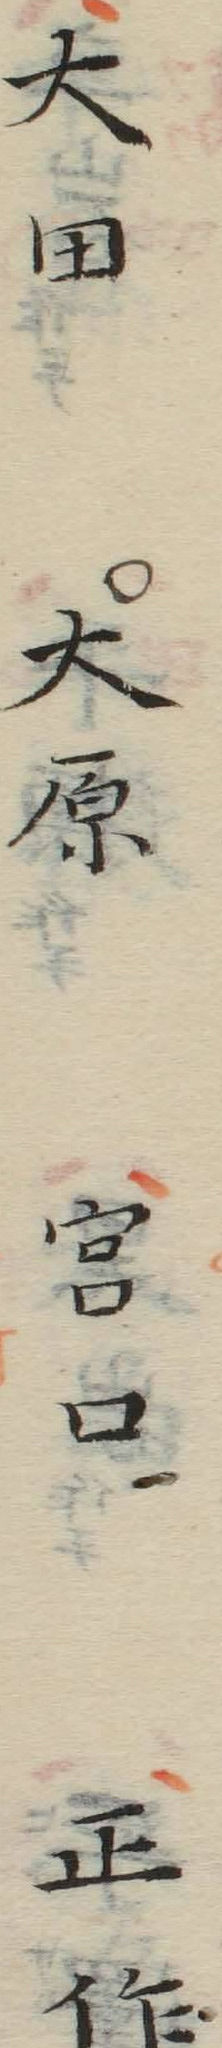大田○大原宮口正作

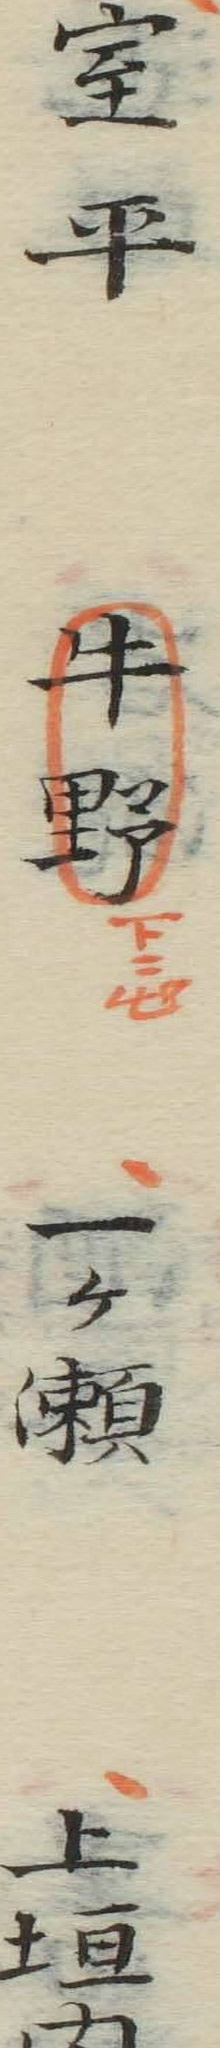室平牛野一ケ瀬上垣内
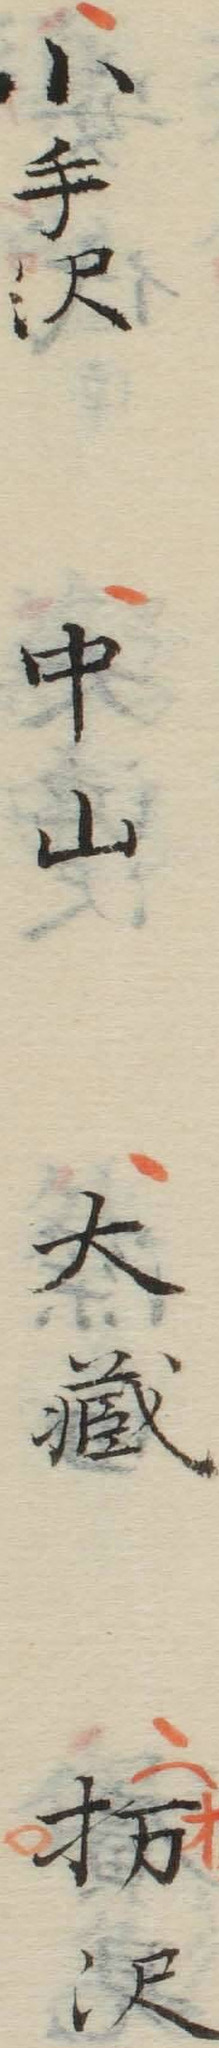小手沢中山大藏橡沢

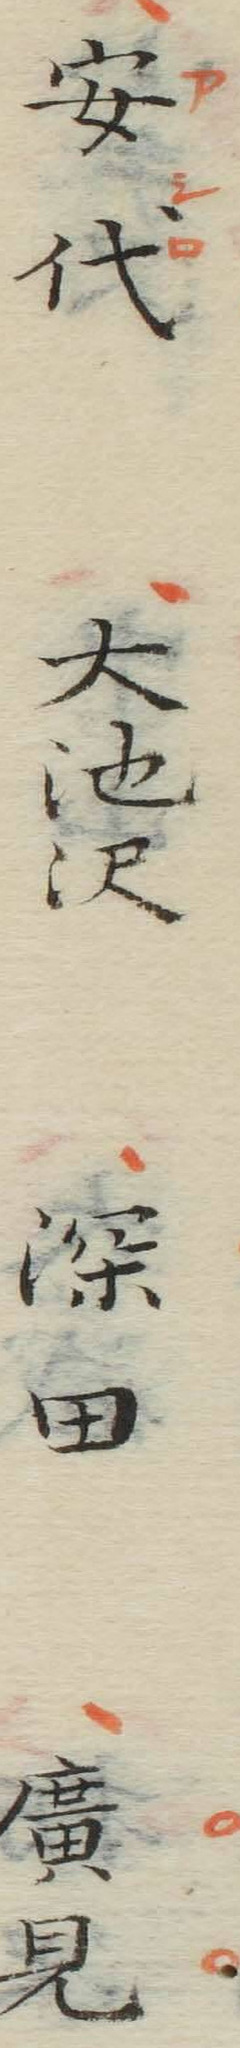安代大池沢深田廣見
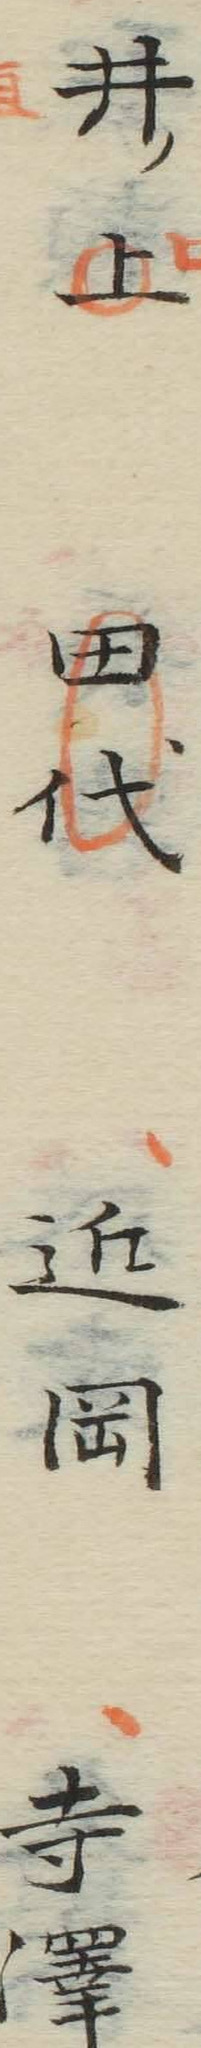井ノ上口田代近岡寺澤
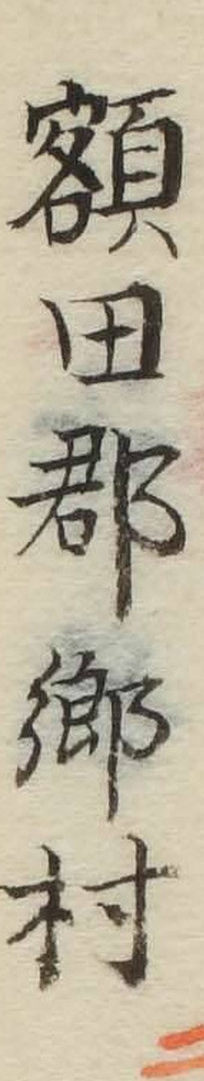額田郡郷村
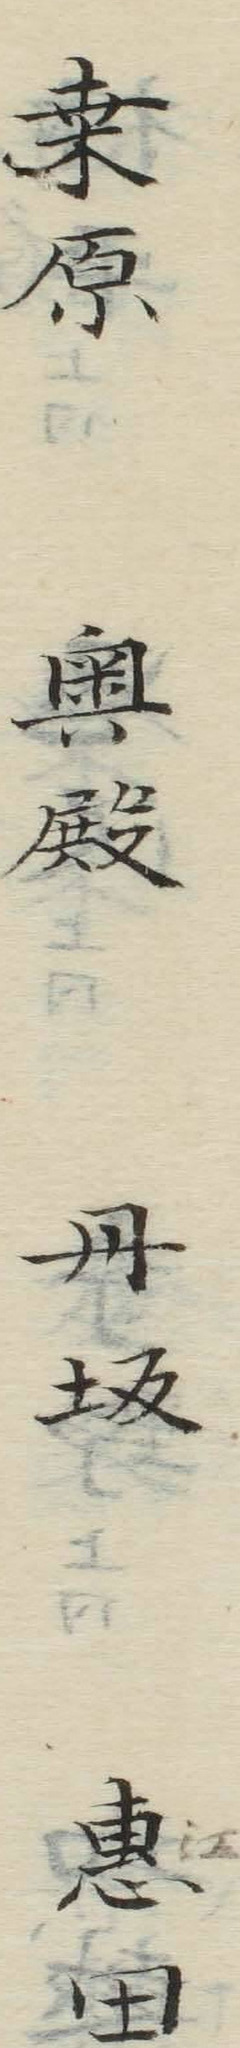桒原奥殿丹坂惠田
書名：三河国二葉松
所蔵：国文学研究資料館
